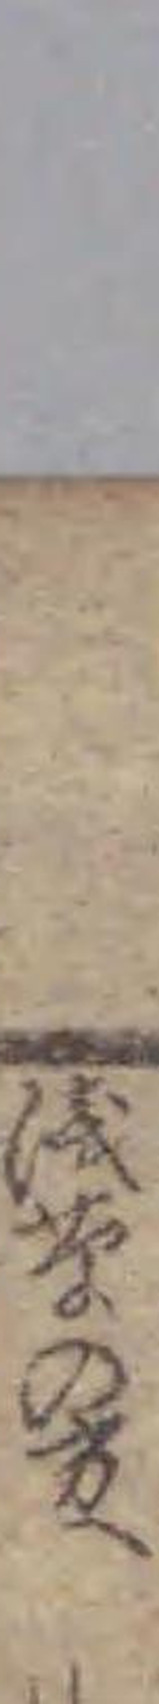浅草の方へ
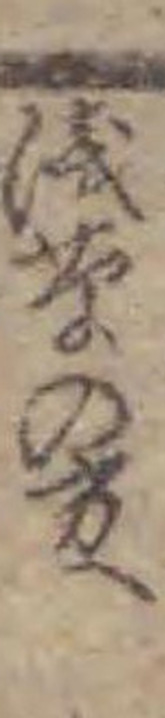浅草の方へ
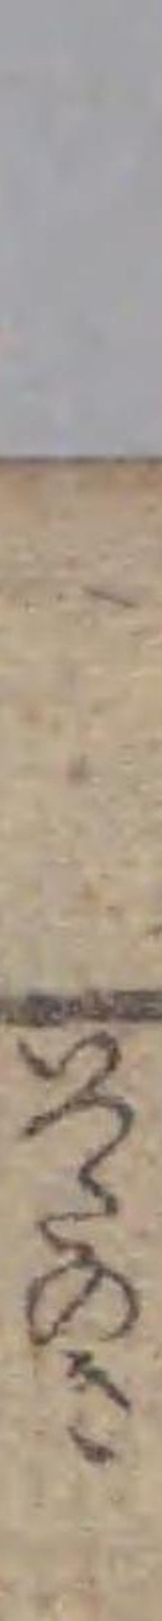いつたのき
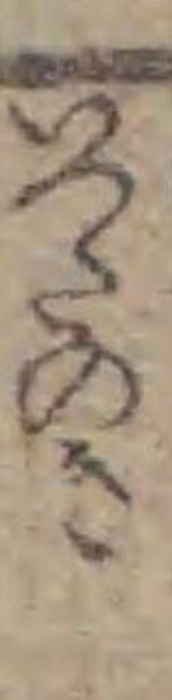いつたのき
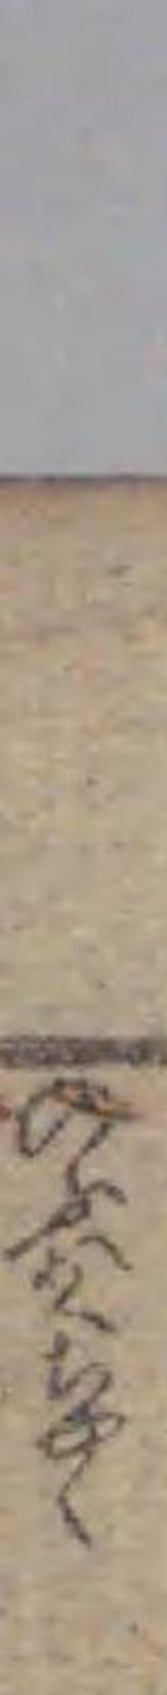のふはくちやく
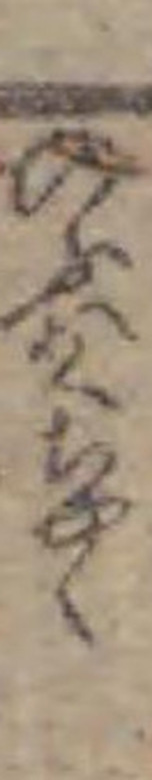のふはくちやく
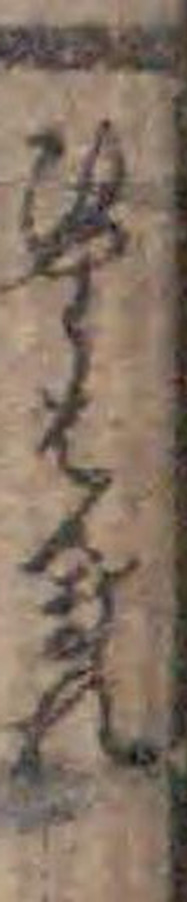ひやうはんされ
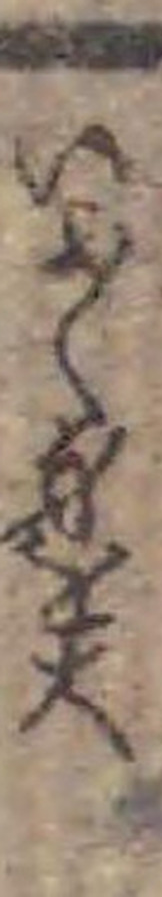いよ〳〵身を大
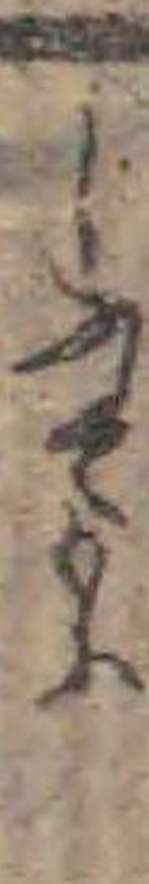しにてもふ
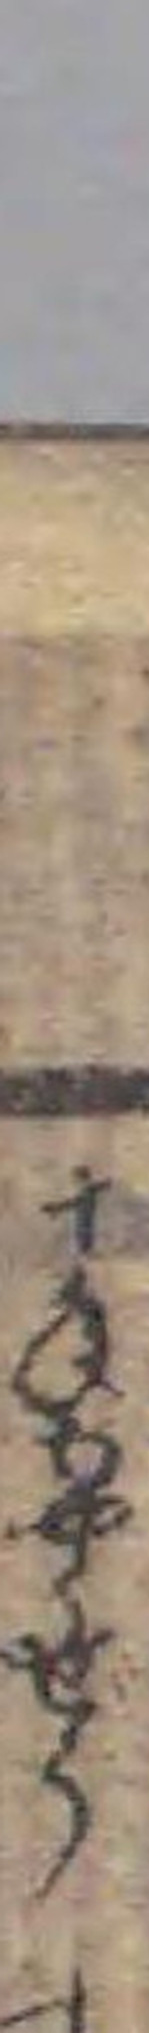十年もやうぜう
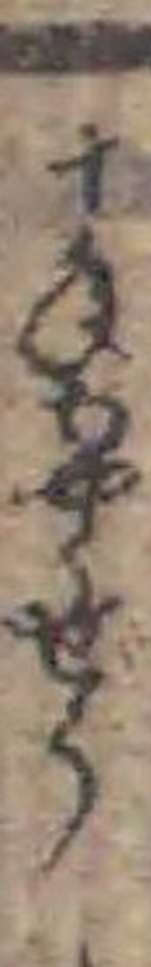十年もやうぜう
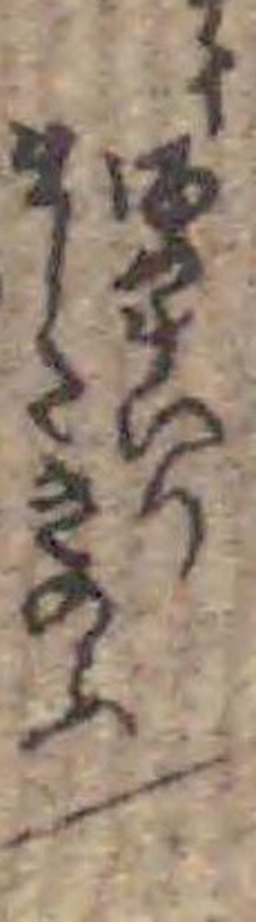ましたきのふ
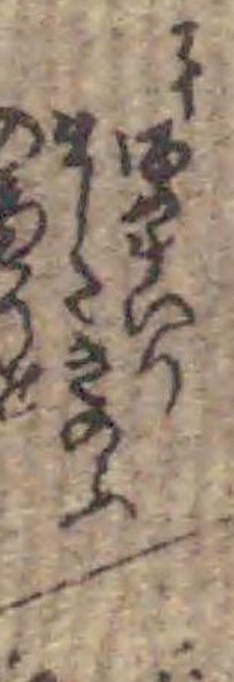ましたきのふ
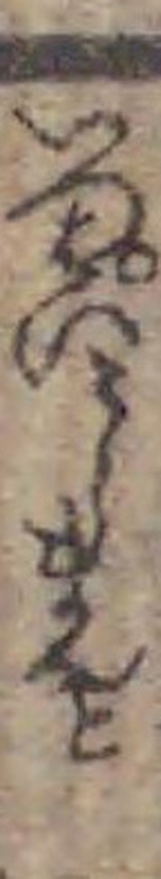いつぱいにのまんと
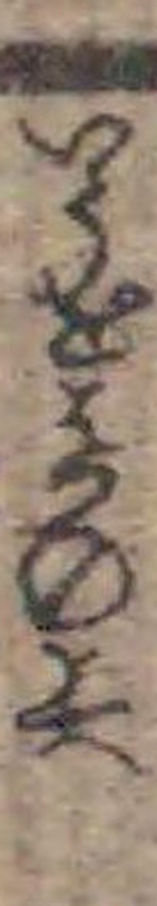いうをはらの上へ
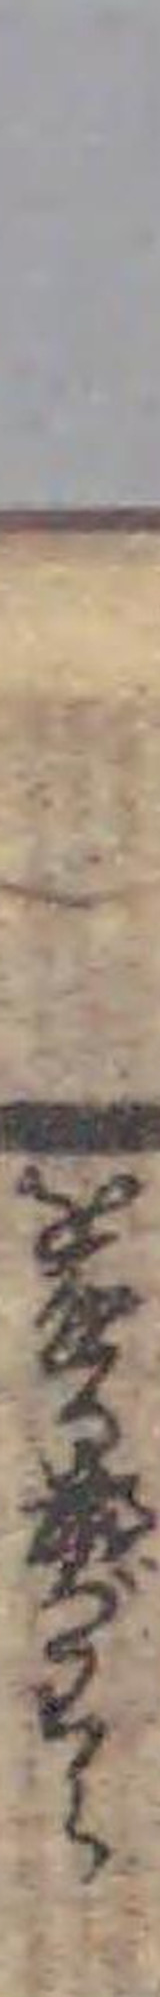を通るがわら
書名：通風伊勢物語 : 3巻
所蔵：国立国会図書館 National Diet Library, JAPAN
